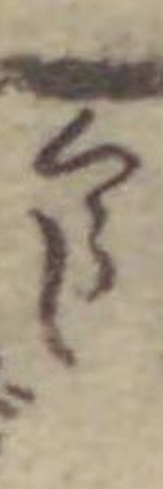くらし
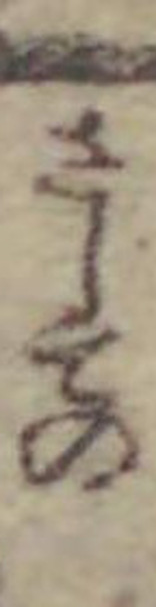さしての
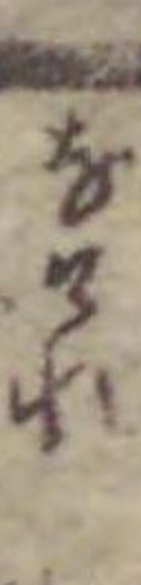なけれ
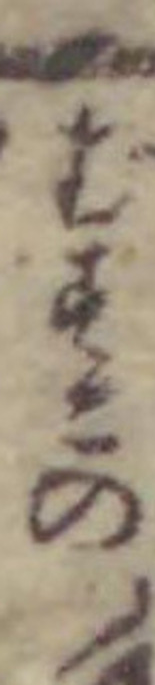むすこの
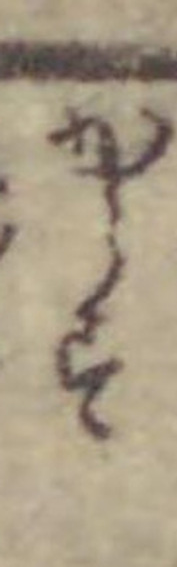からす
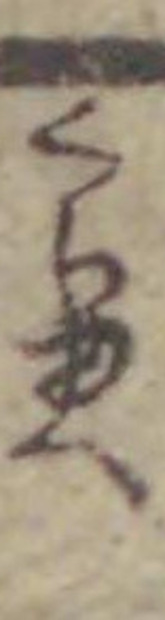くちゆへ
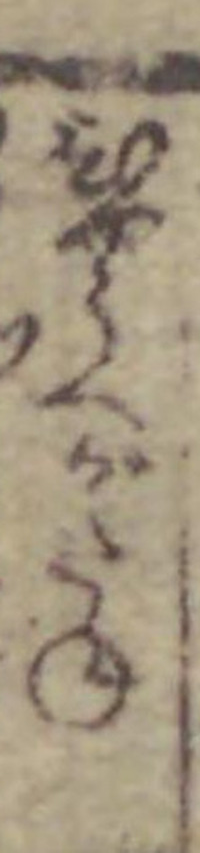ひやうへかたね
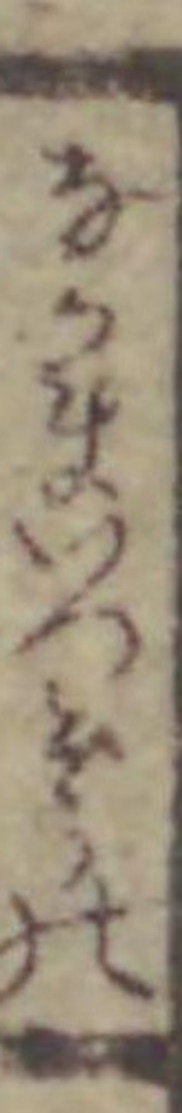なかまいつどうの
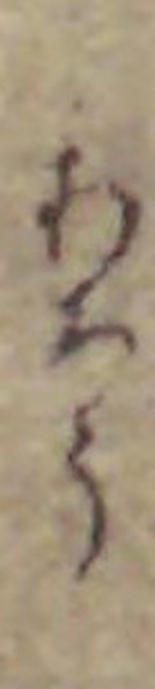あほう
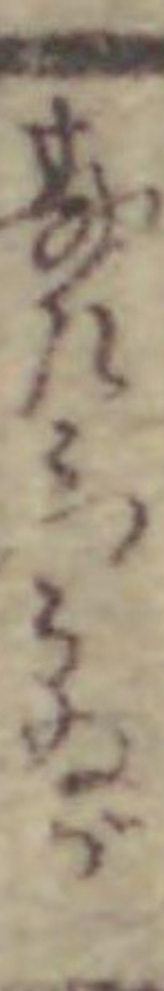勘左衛門うぬが
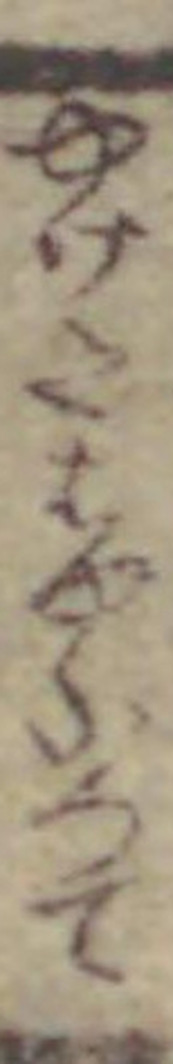やけたはやくいつて
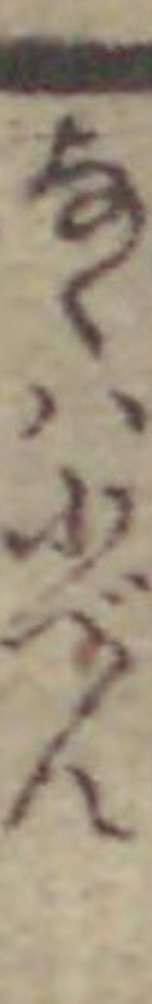なくハ小べん
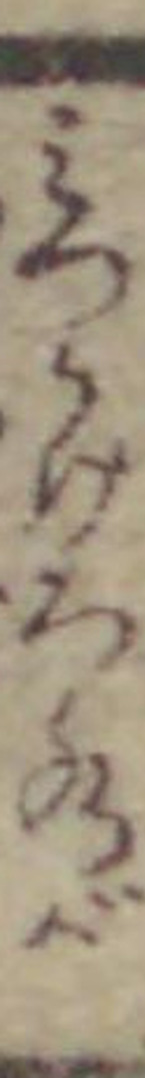ミつかけろ水バ
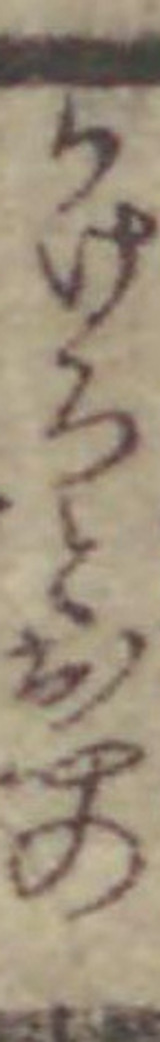かけろとおやの
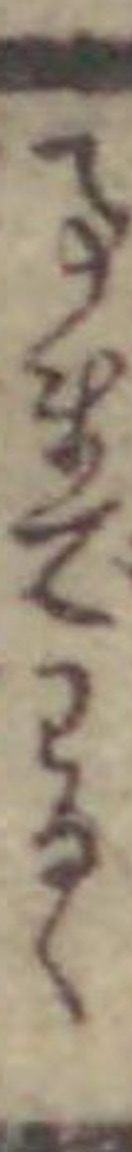事までわるく
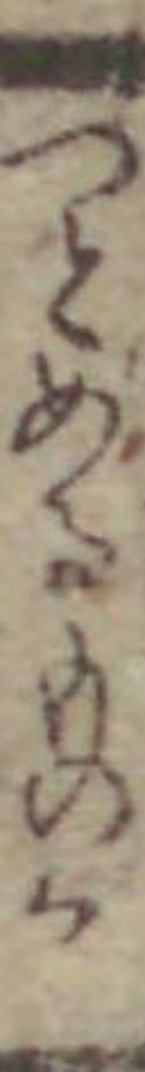つとめるものか
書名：烏行水諺草 3巻
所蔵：国立国会図書館 National Diet Library, JAPAN
